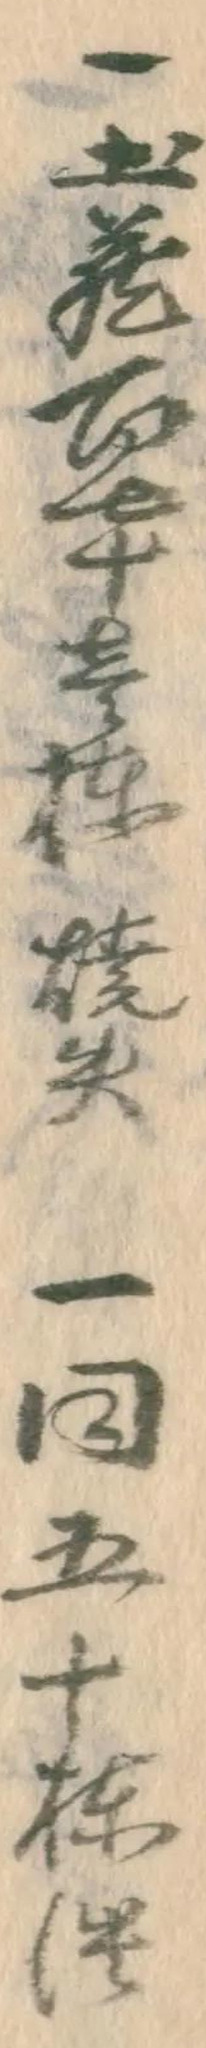一土蔵百七十壱棟焼失一同五十棟潰
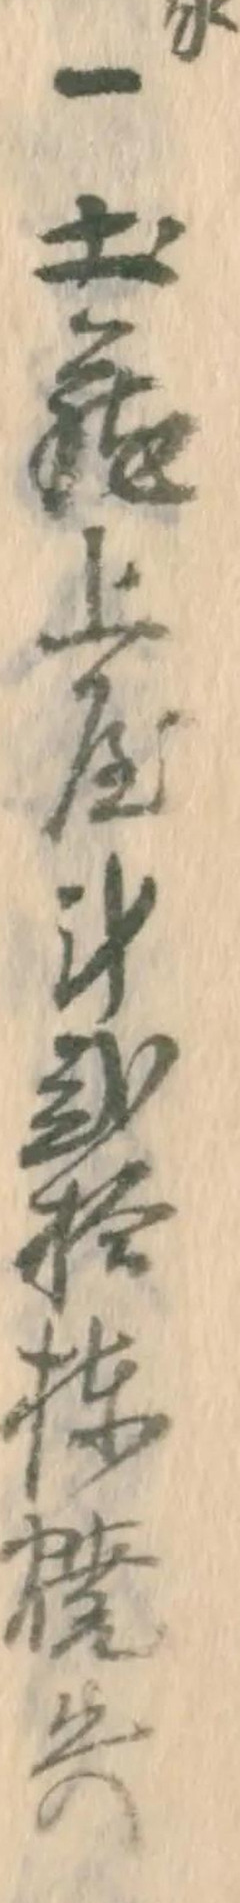一土蔵上屋斗弐拾棟焼失
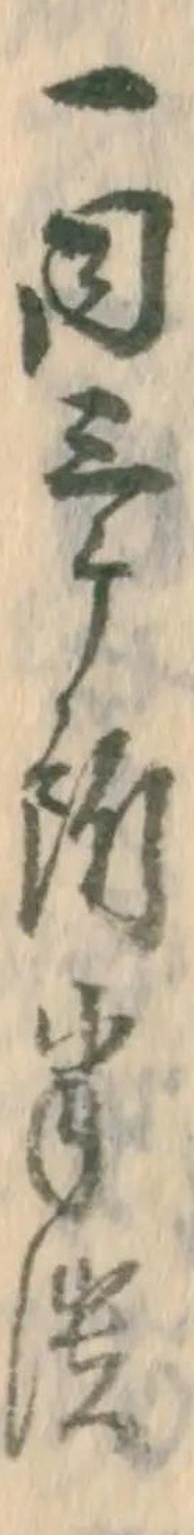一門壱ヶ所半潰

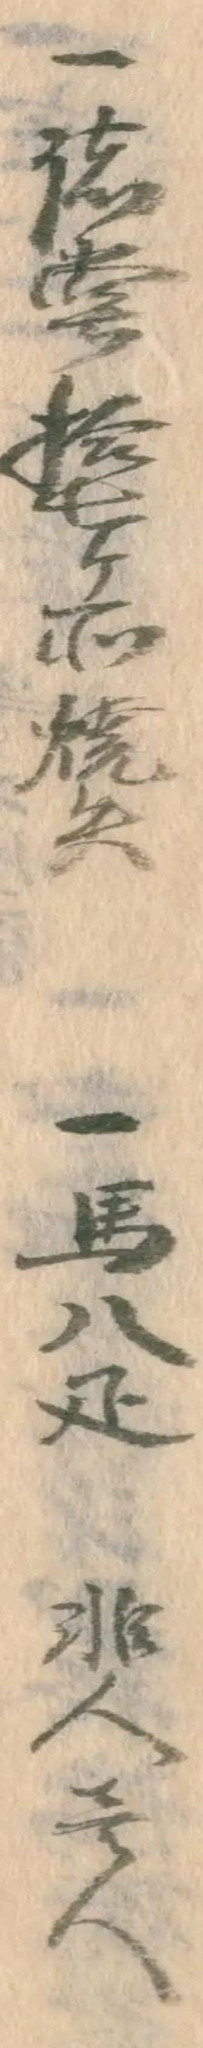一諸堂拾七ヶ所焼失一馬八疋非人一人
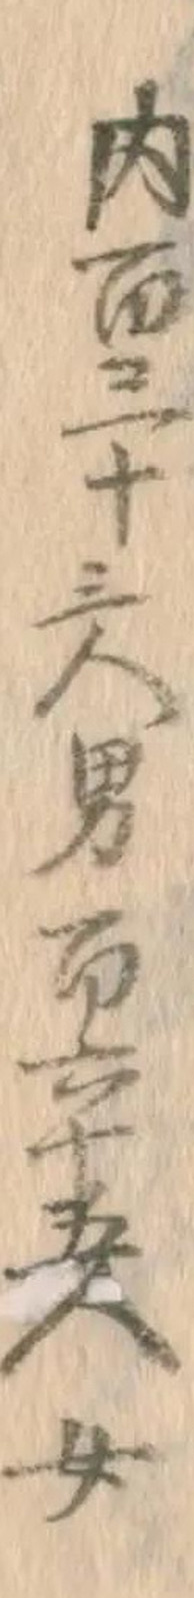内百三十三人男百六十五人女
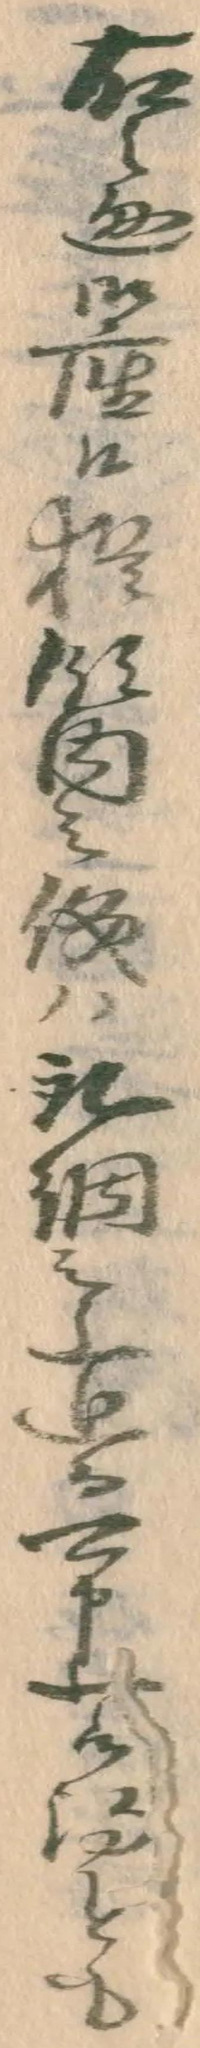右之通御座候猶領内之儀ハ取調之上追而可申上候得共
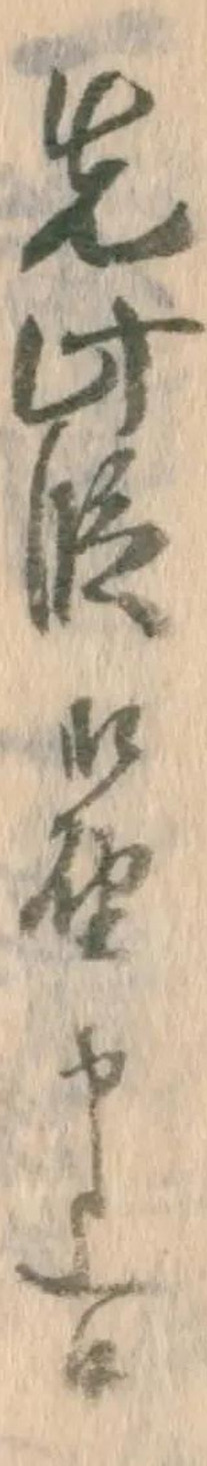先此段御届申上候
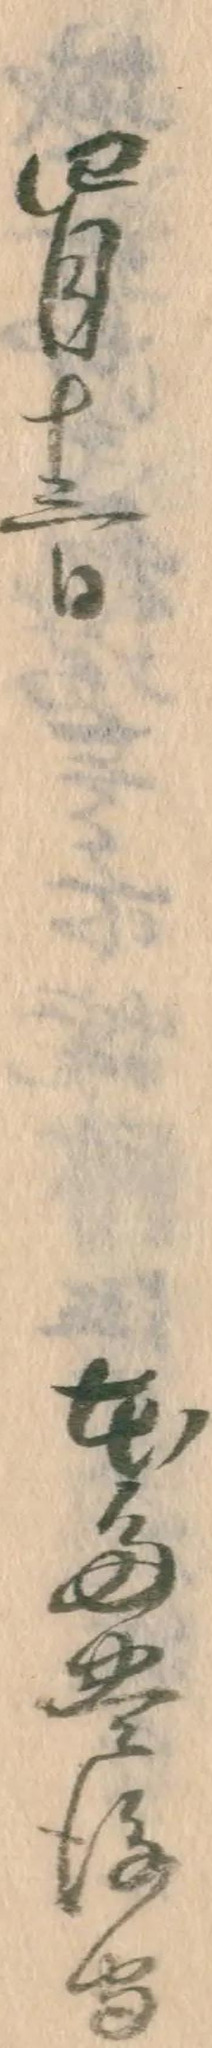四月十三日本多豊後守
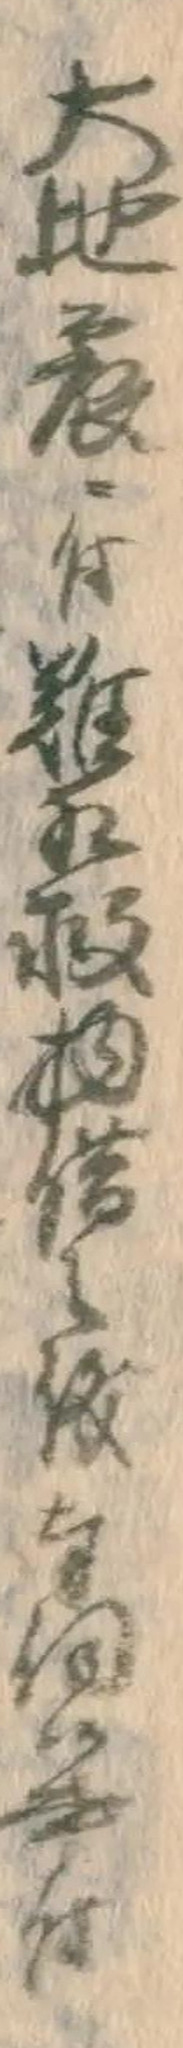大地震二付難相救拝借之儀ニ付奉伺候書付
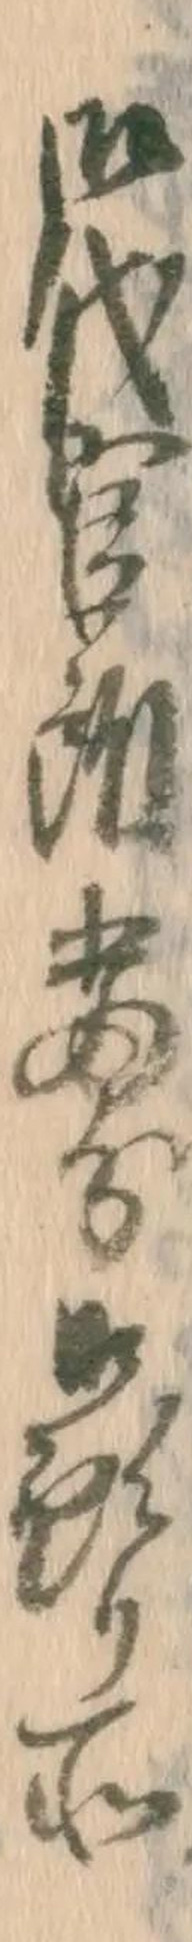御代官所当分御預所
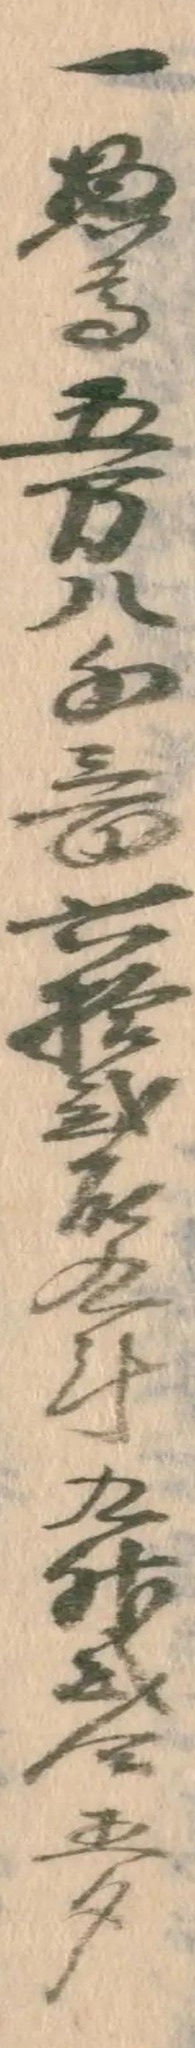一惣高五万八千三百六拾弐石九斗九升弐合五勺
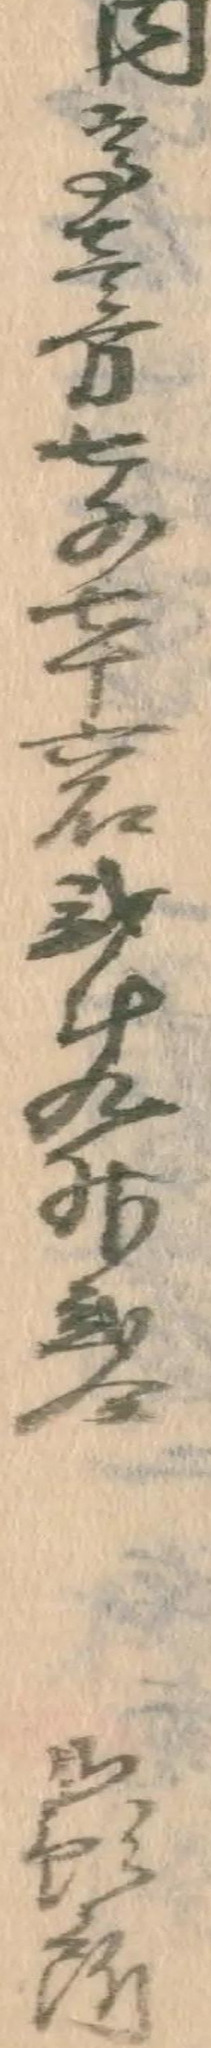内高壱万七千七十六石弐斗九升弐合御預所
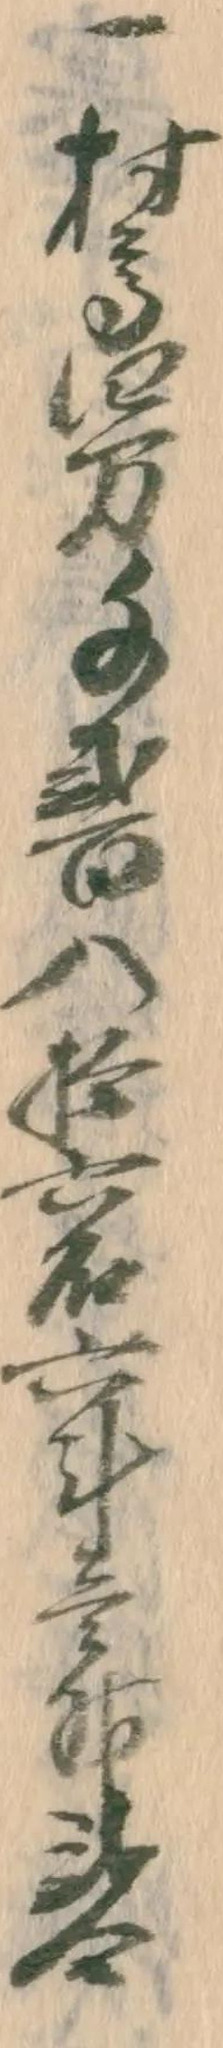一村高四万千弐百八拾六石六斗壱升弐合
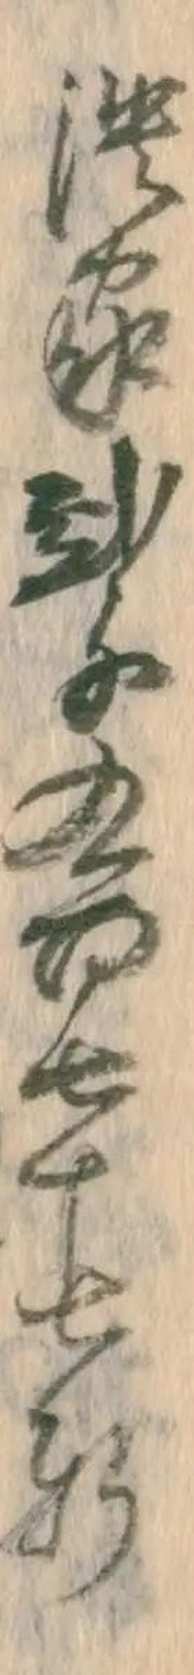潰家弐千九百七十七軒
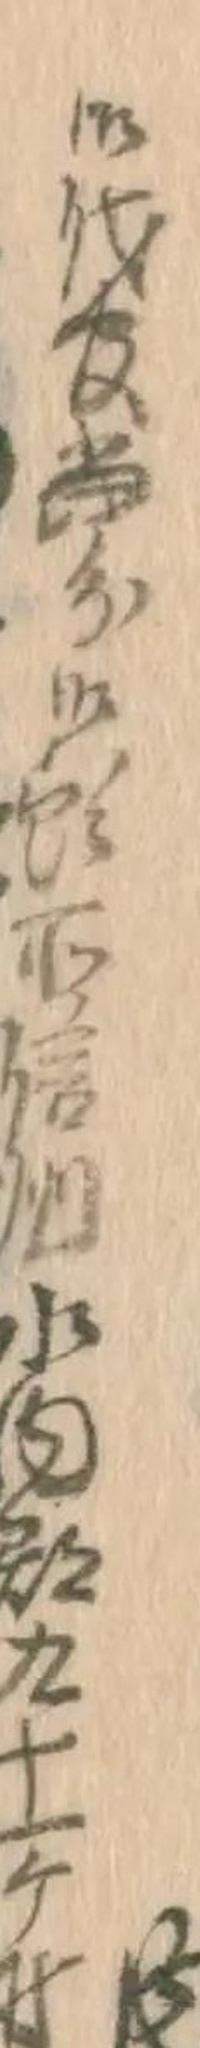御代官所当分御預所信州水内郡九十一ヶ村
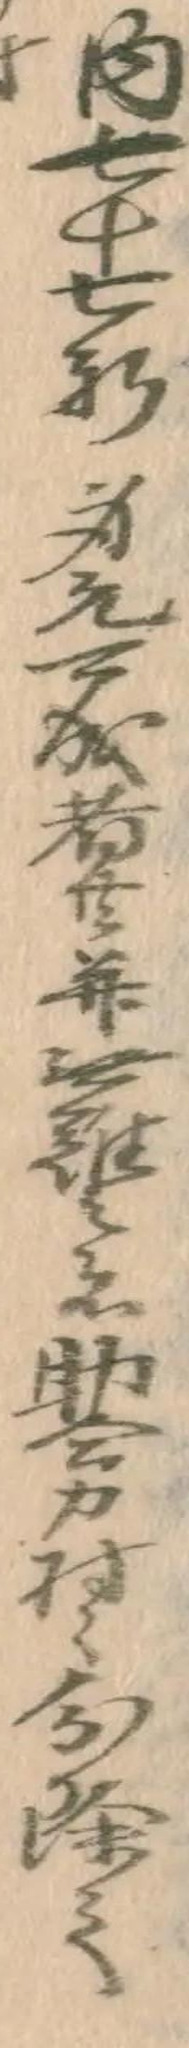内七十七軒身元可成之者共并無難之者助合候村々分除之
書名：信州大地震之記
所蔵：国立国会図書館 National Diet Library, JAPAN
